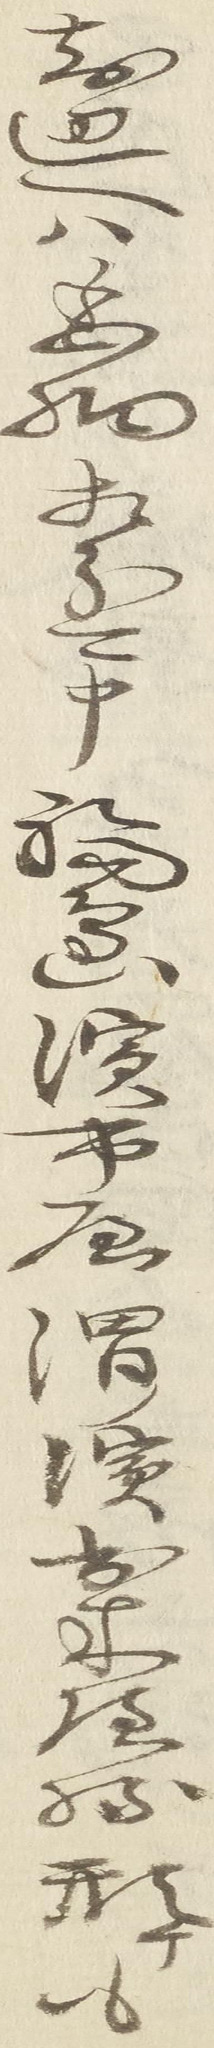知辺へは委細相分可申福島浜市屋渭ノ浜出来屋抔形チも
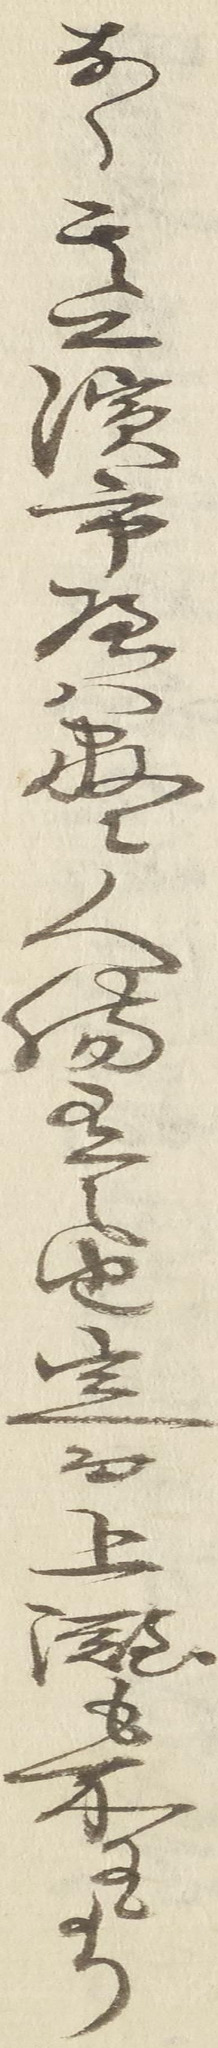なく其上浜市屋は数々人傷有之候由定而上瀧も所により
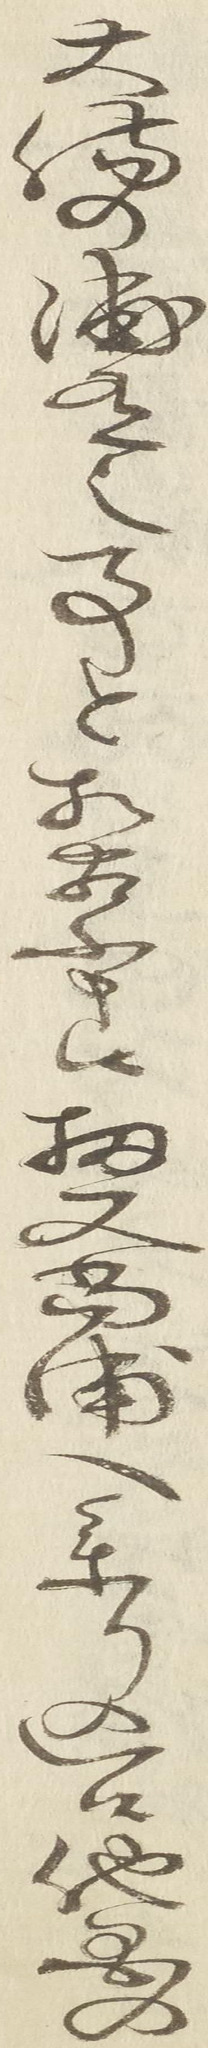大傷の浦有之事と相聞不申候扨又当浦へ参り込候他国の

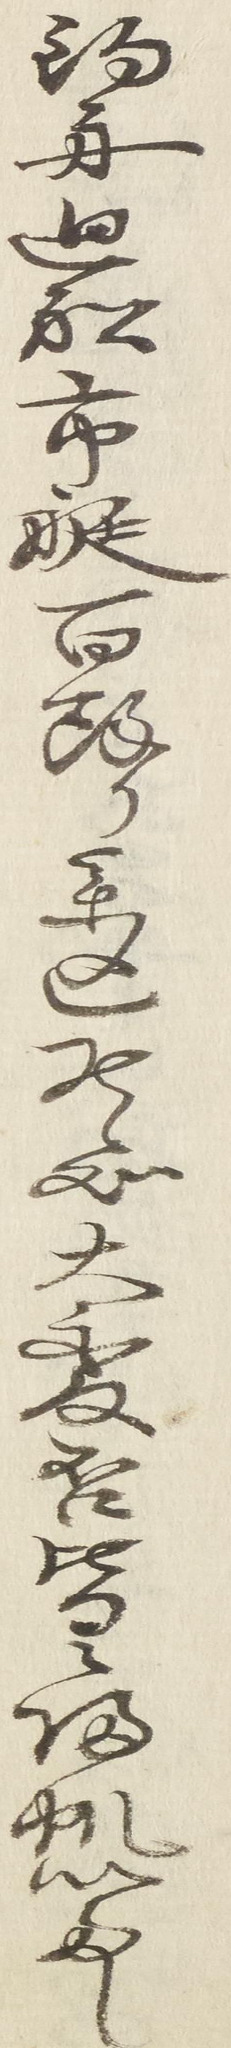釣船廻船市艇百餘り乗込居候処大変否皆々帰帆いたし
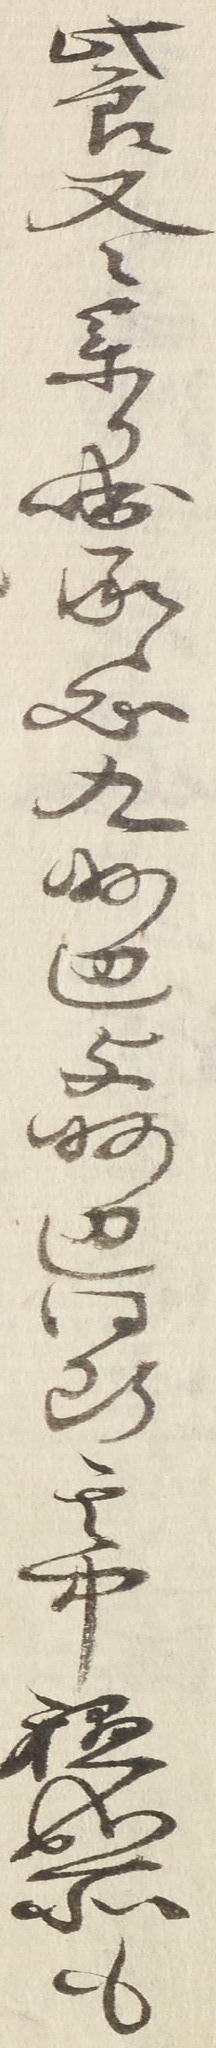此節又々集り咄承候処九州辺与洲辺同断其中穏成所も
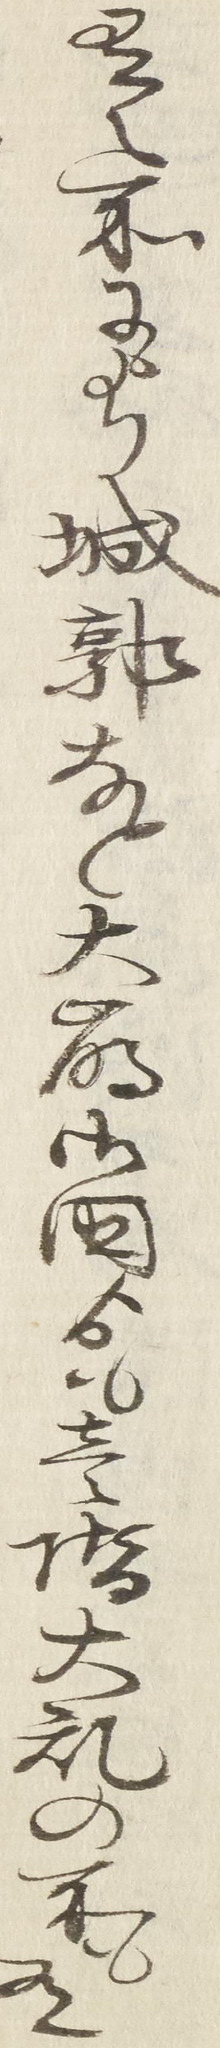有之所により城郭なと大崩御国ゟも壱諧大乱の所も有之
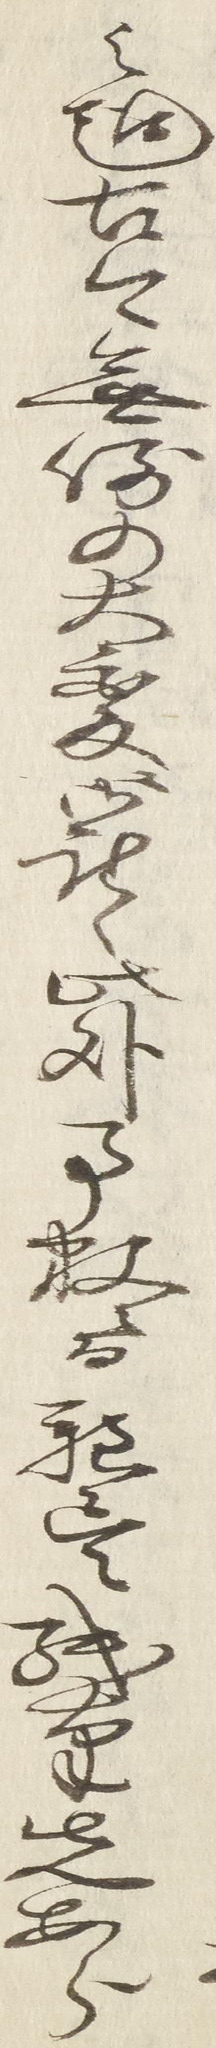之趣古今無例の大変に御座候此外事数二而難尽紙筆先あら
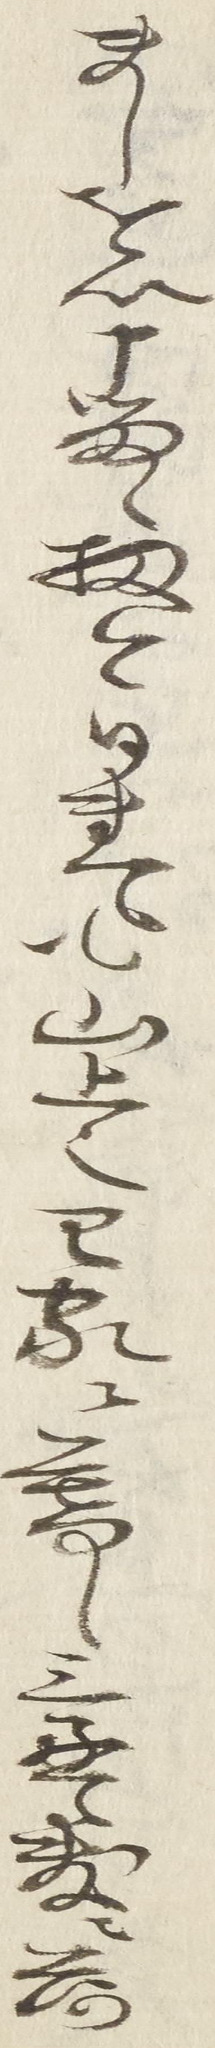ましを以申留候扨今日までも山上之已家に暮し三畳敷に荷
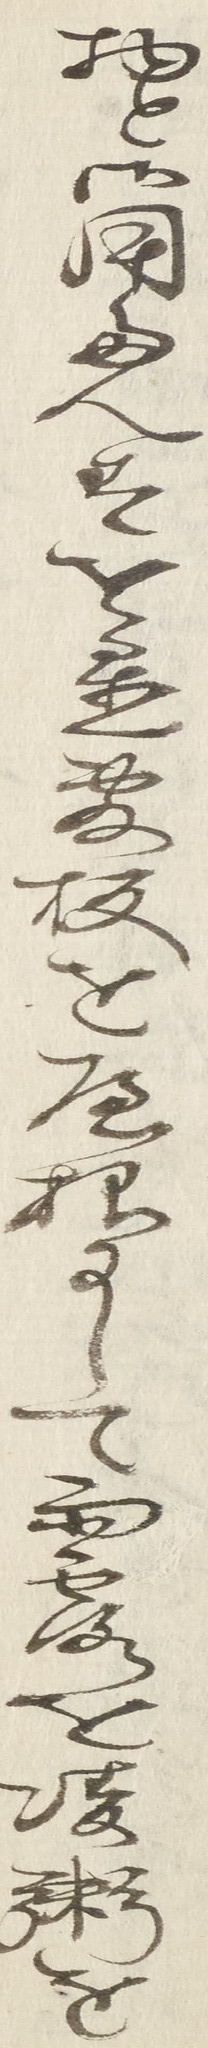物と御用たんすを置敷板を屋根にして雨露を凌粥を
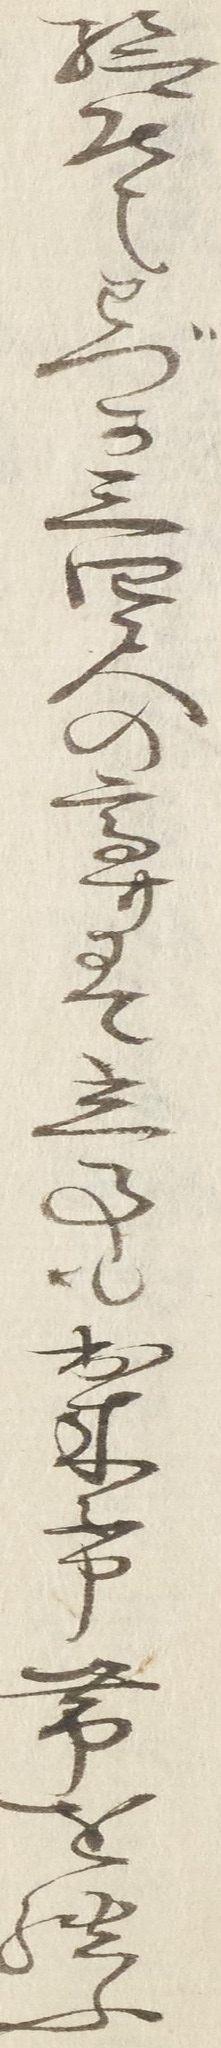給居申候わづか三四尺の高さにて立事も相成不申帯を結ふ
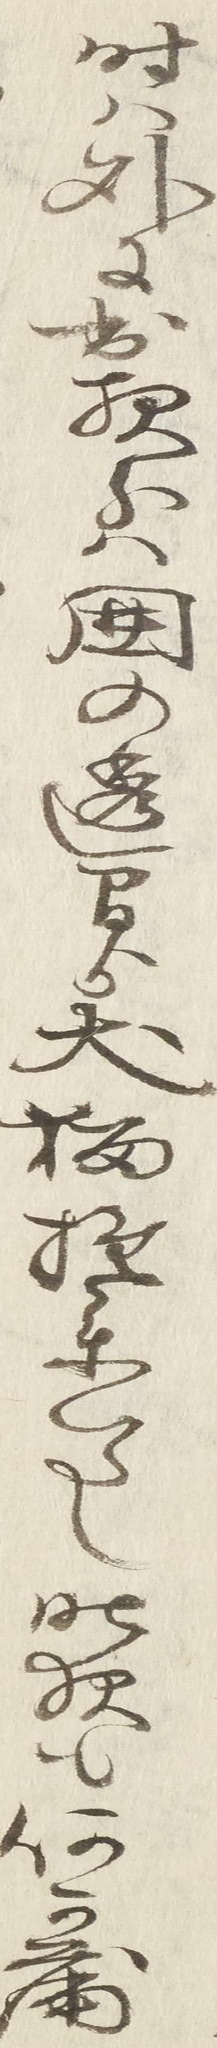時は外に出夜分は囲の透間ゟ犬猫推参いたし昨夜も何か蒲
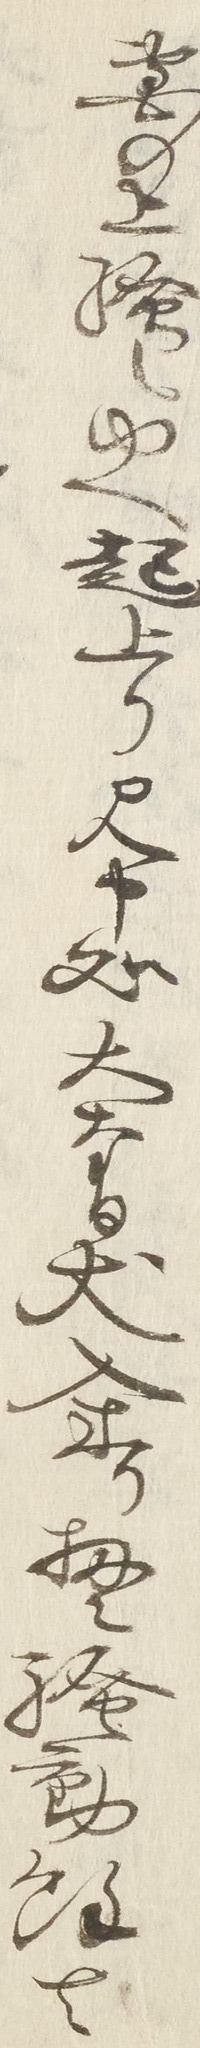団の上騒しゆへ起上り見申候処大なる犬入来り扨々騒動餘は
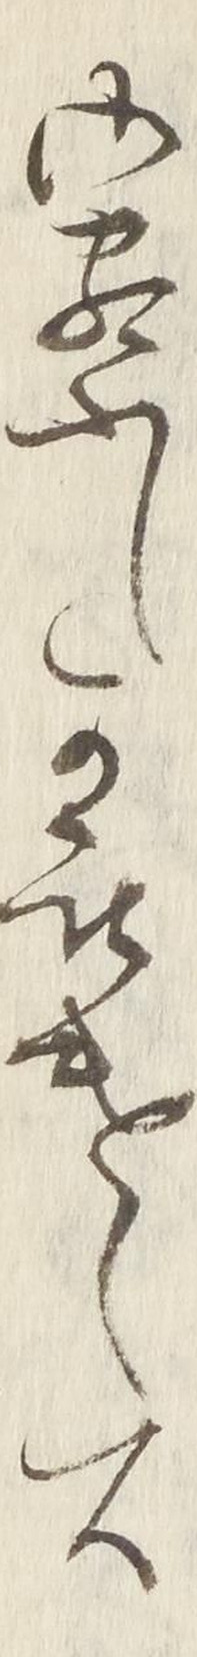御察し可被遣候以上
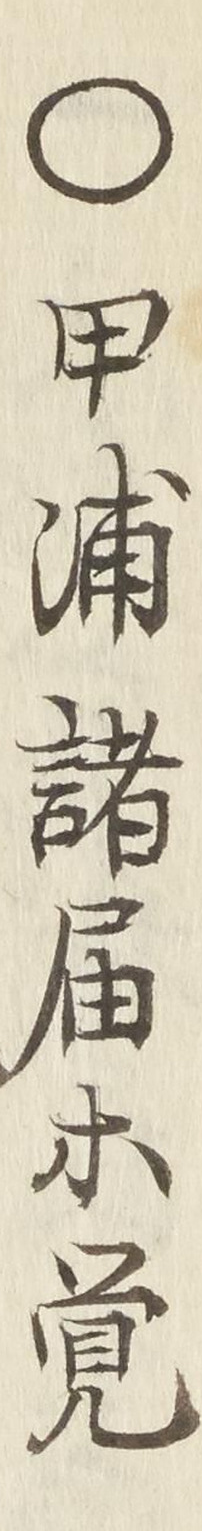◯甲浦諸届等覚
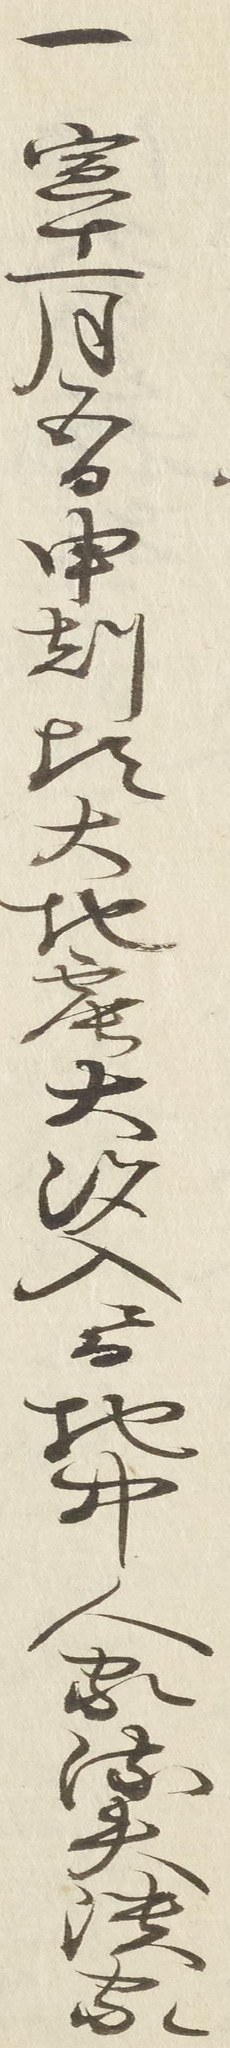一寅十一月五日申刻頃大地震大汐入二而地中人家流失潰家
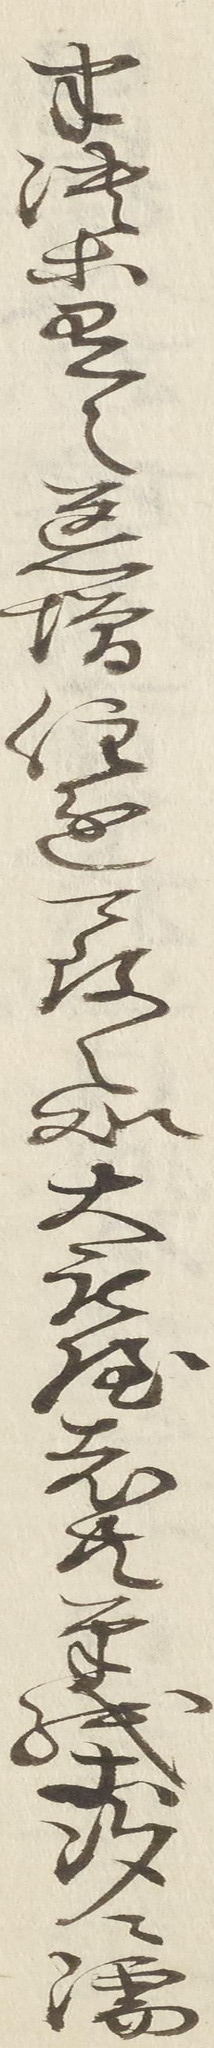半潰等有之荒増注進可致候処大庄屋老共筆紙等汐に濡
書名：地震記　下
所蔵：東京大学地震研究所図書室 Earthquake Research Institute Library, The University of Tokyo, JAPAN
